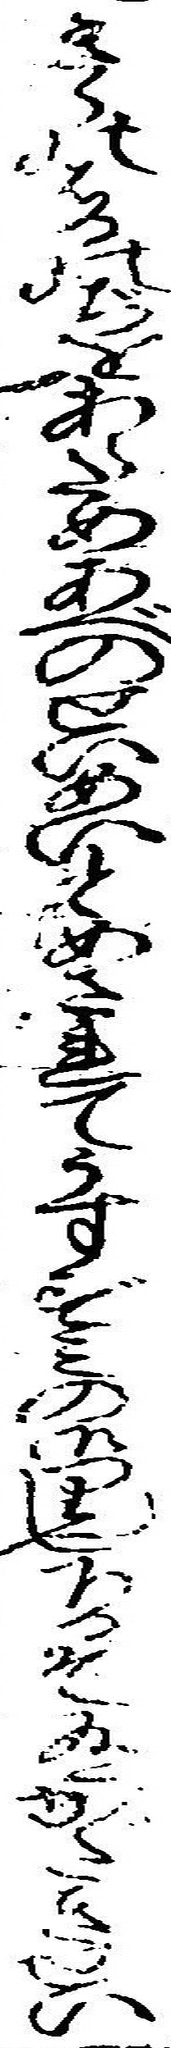きらのはるのぢをあらためあべのせいめいとめされてうすずみの御りんし下るそ有がたきせい
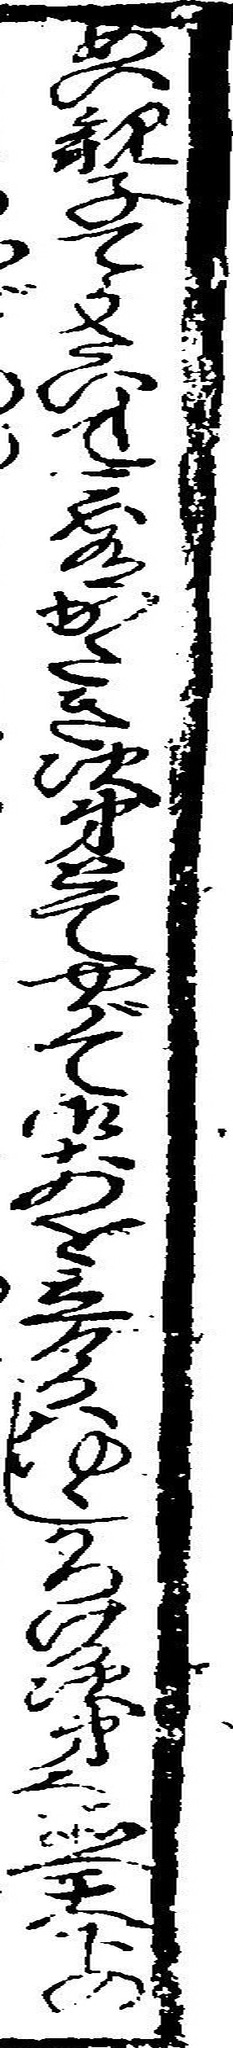めい親子てうたいしてこは有かたき次第とてやがて御前を立けるはゆゝしかりける次第也所へ天下の
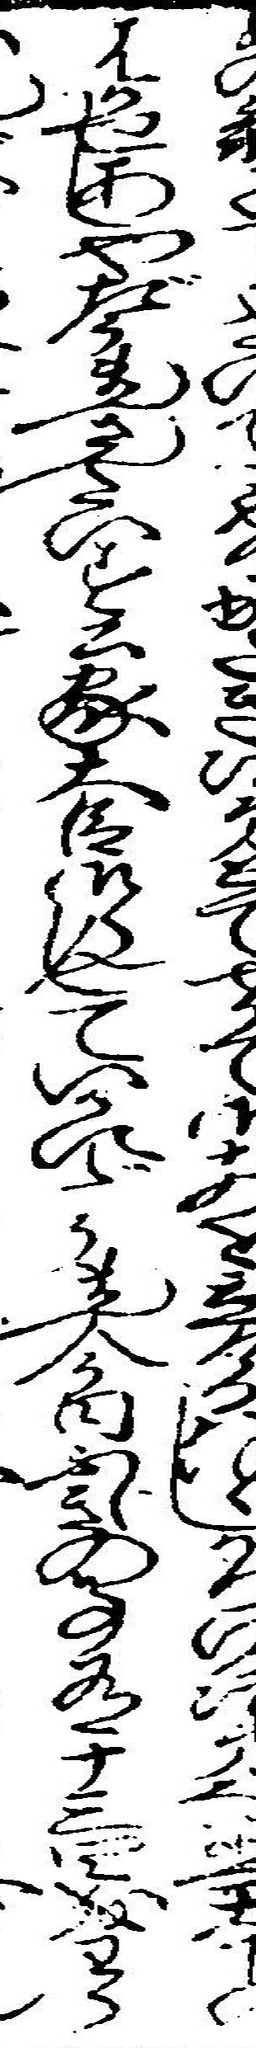はかせあしやだうまんさんたいすくげ大臣御らんしていかにだうまん今日ふしきのこと有十三四成わら
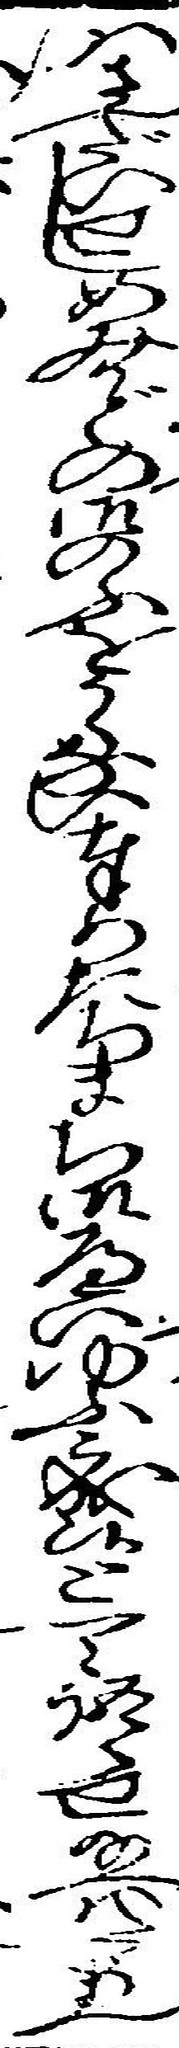はさんだいせしめみかどの御のふをうらない奉りたちまちごへいゆふ被成候と一々語らせ給へはたうまん
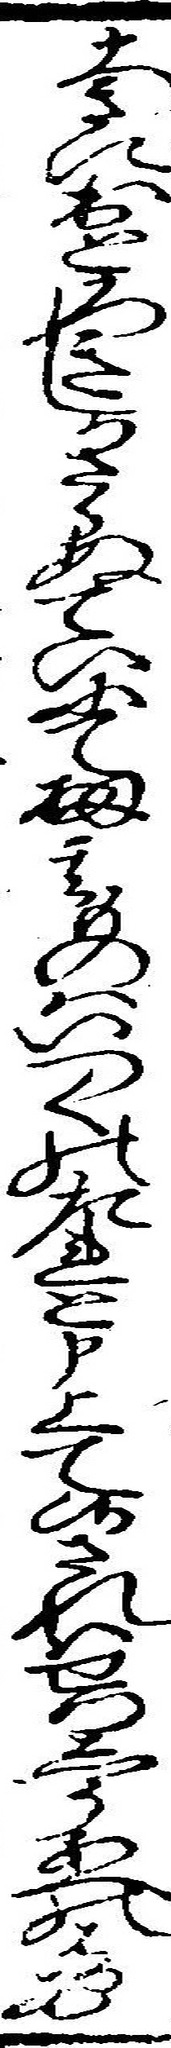大におとろきしかさらぬていにて扨其ものはいつくのたれと申上て候されはせつしうあへのはるあ
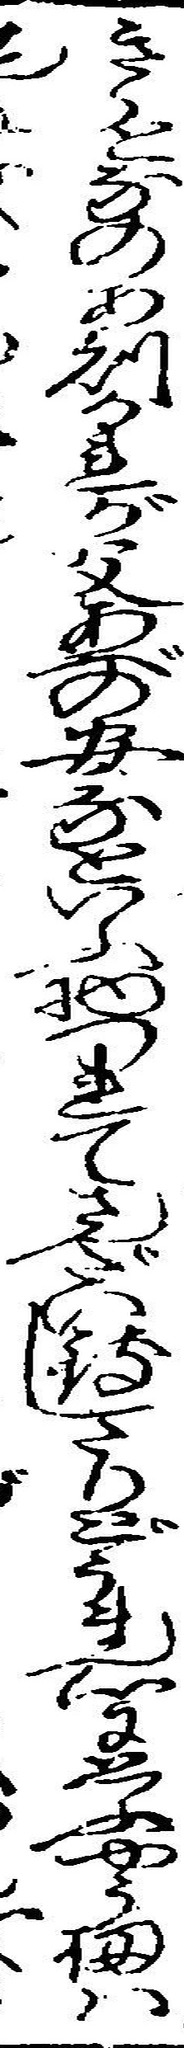きらとなのり則かれが父あべの安なといふ物つれてさんだい致したりどうまん心に思ふやう扨は
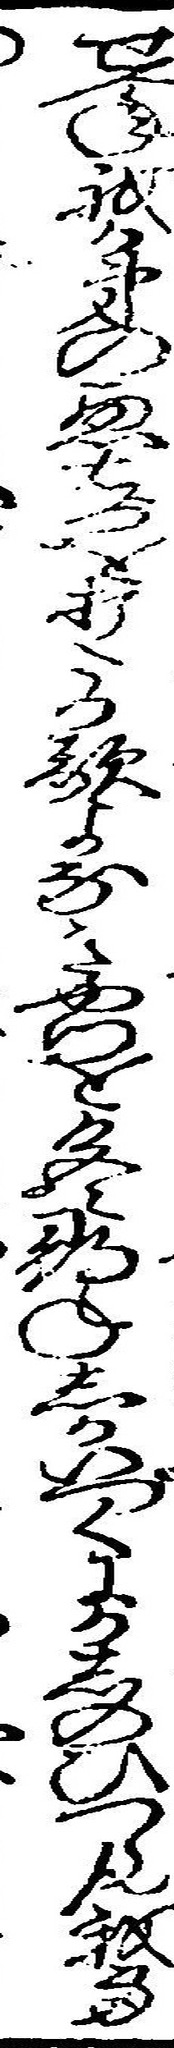せん年我か弟の悪右衛門を打たる敵よなきやつを色々尋ねしかいづくにかしのひつらん我身
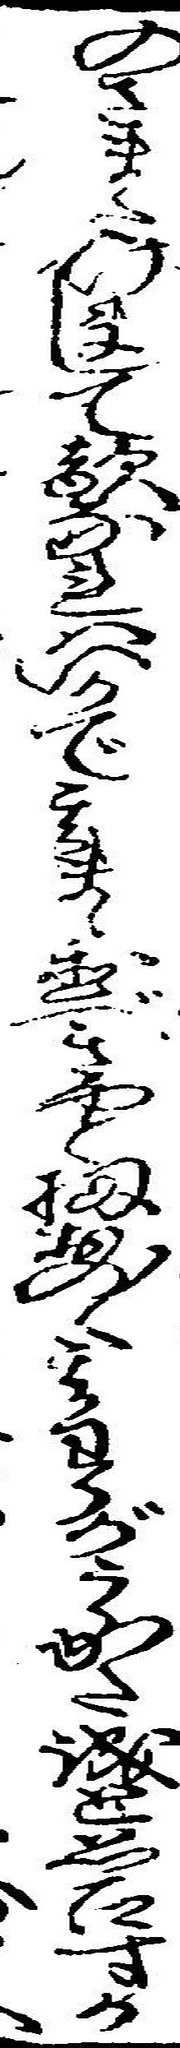のさまたげまして敵なれはいかで其まま置べきやと扨おの〳〵其わらがうらかた誠と思召すか
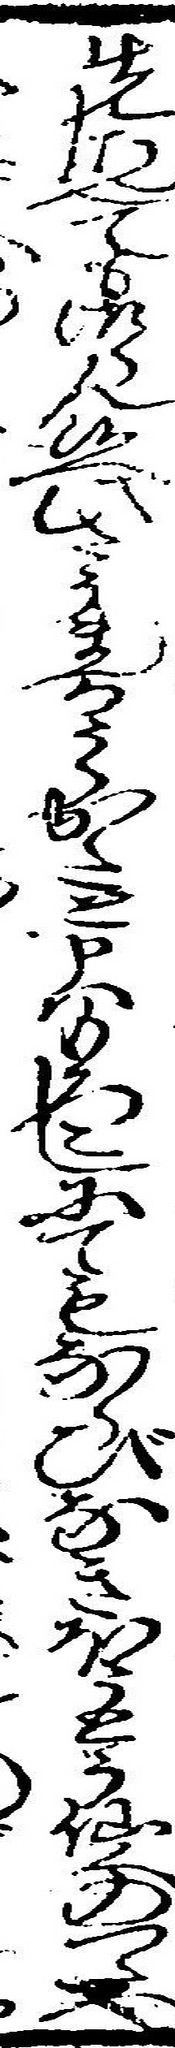先あんしても御らん候へ此たうまんかうらかたと申はもろこしにてもならびなきほうとう仙人のつたへ
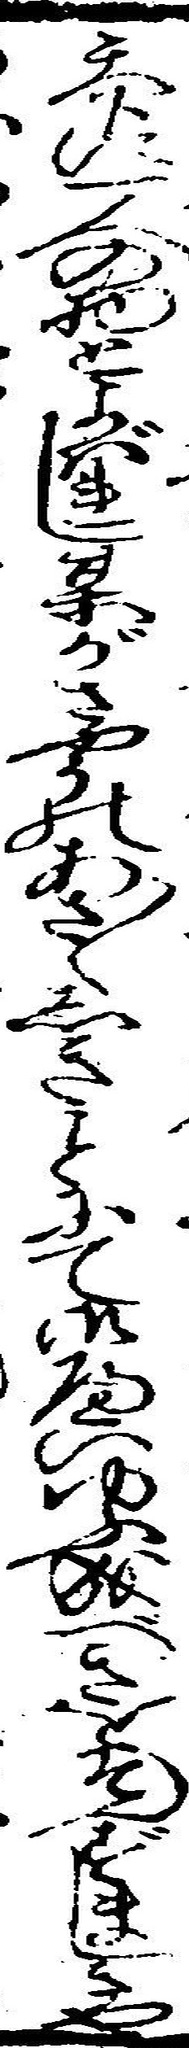天下に一人の物とよばれし某がさやうのあさ〳〵しきことにて御へいゆふ成べきをそんずましきや
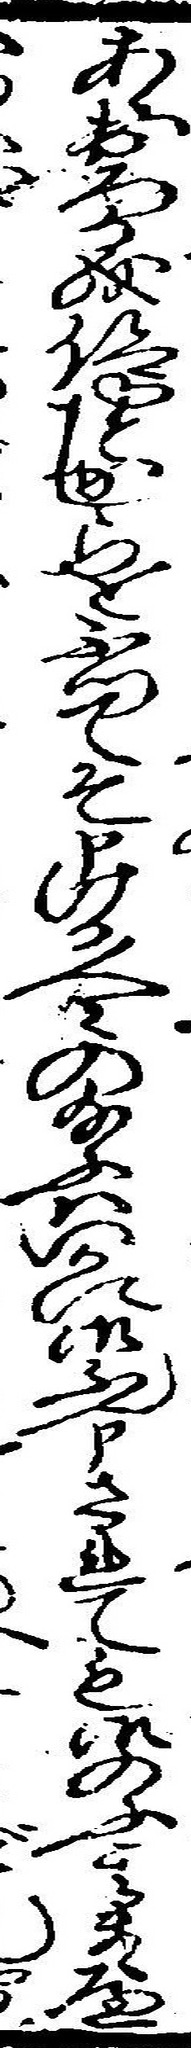あゝおろか成仰せ哉？とかしらをふつてそ申ける人々の給ふはいかに御ふん申されても御のふ其まゝへ
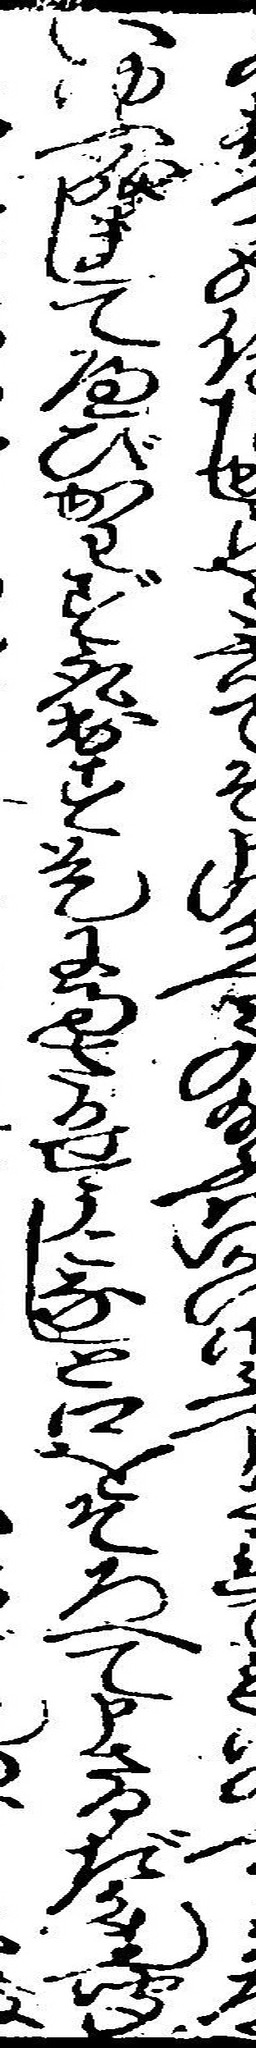いゆふ成ましてへびかわず取出す是に過さるせうこなしと口をそろへて申さるだうまん聞
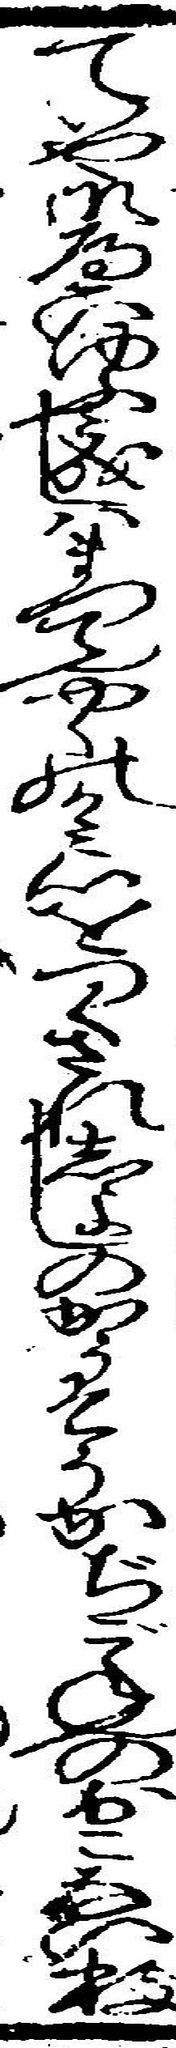ていや御へいゆふと被成はまつてんやくのかみ心をつくされしよしのかうそうかぢごねんのおこない数
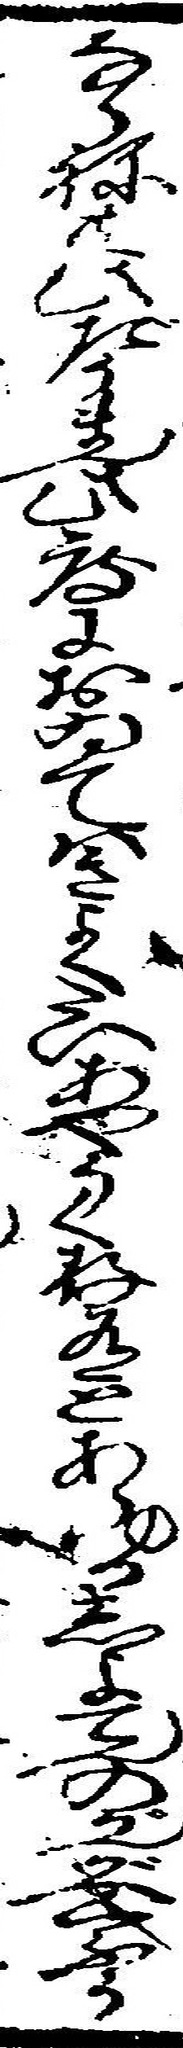ならね共此だうまん此度におゐてはきよくたいあやうく存有とあらゆるしよてんのがんがへくふう
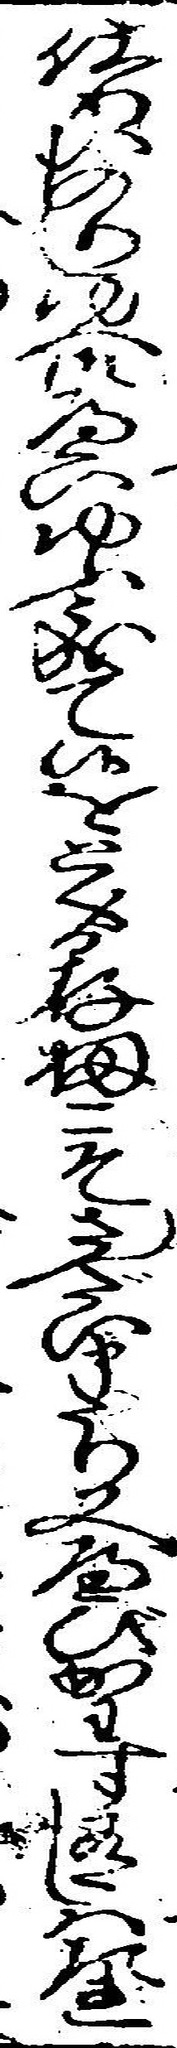仕りいのりしゆへ御へいゆふ被成て候をとくゟ存扨こそさんだい申たり又へびかわす有しはたれ
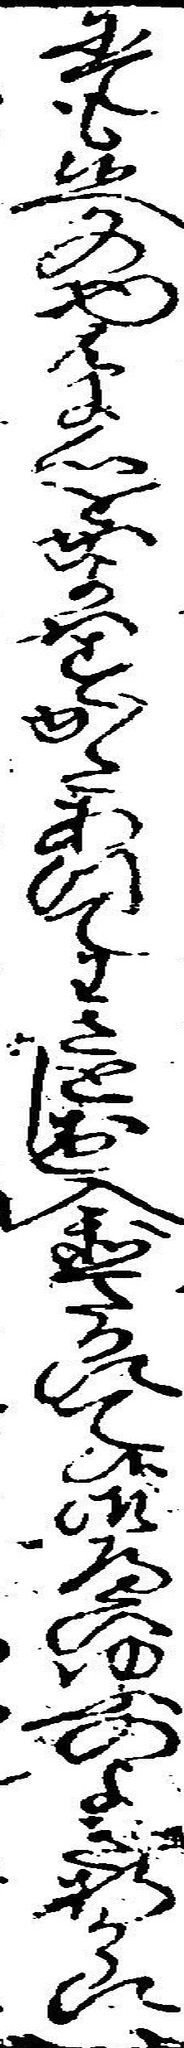にても候へかの物共に心をかよはすかたあつてわさとおし入置たるにて候御へいゆふのよき折からに
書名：[しのだづまつりぎつね付あべの清明出生]
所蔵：東京大学総合図書館 General Library in the University of Tokyo, JAPAN
